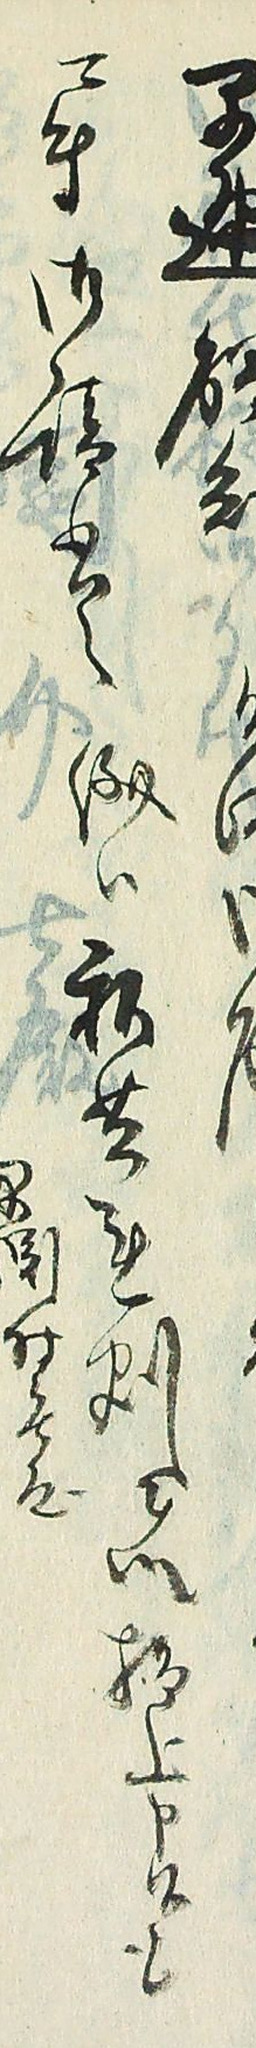に付御請書之儀は私共連判を以指上申候以上
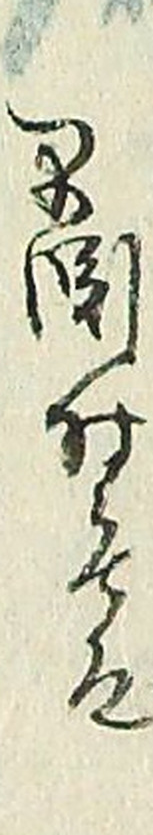早渕村庄屋
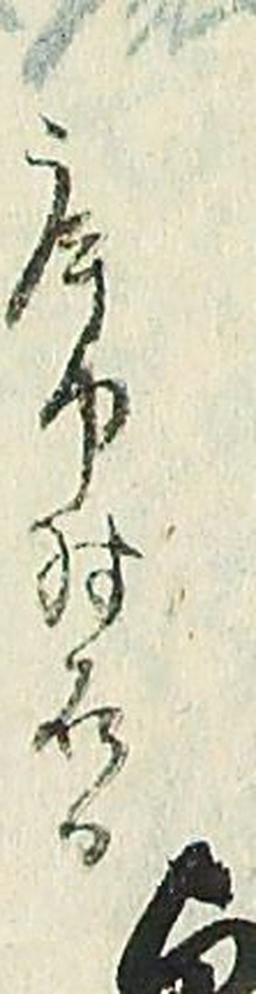矢ノ村右同
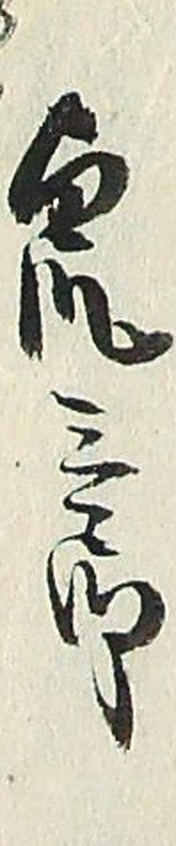虎三郎
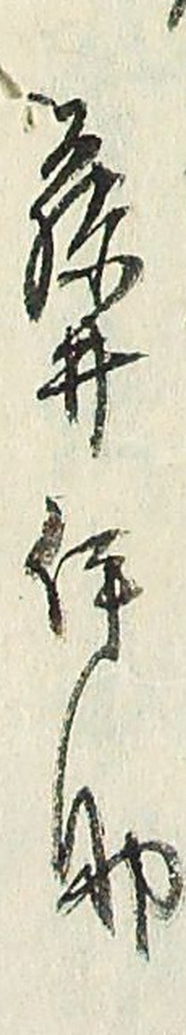藤井伊助
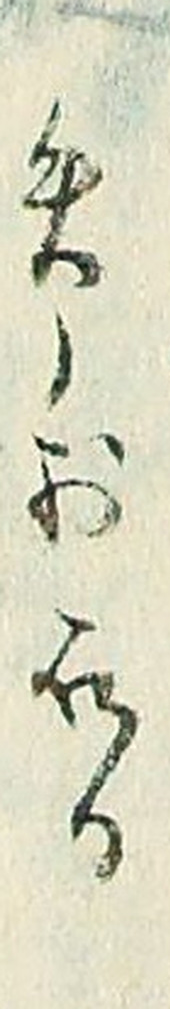矢ノ村右同
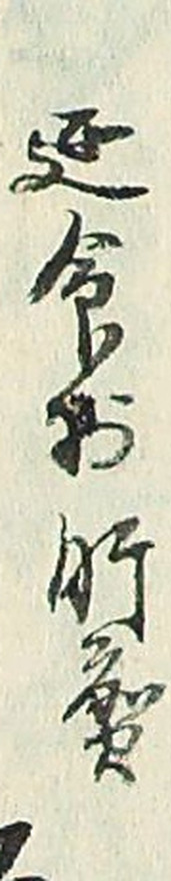延命村肝煎
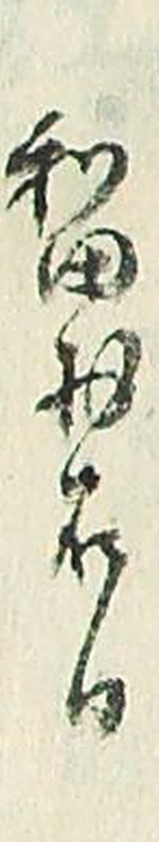和田村右同

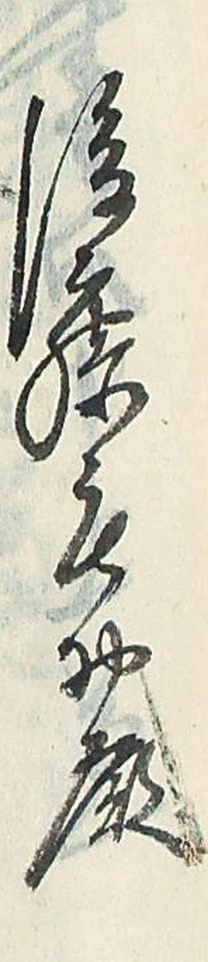後藤庄助殿
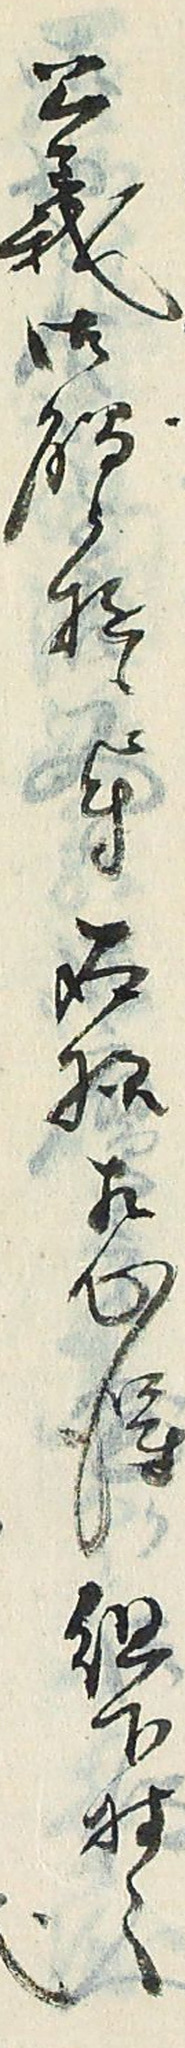公義御触被遊候に付右様相心得組下村々
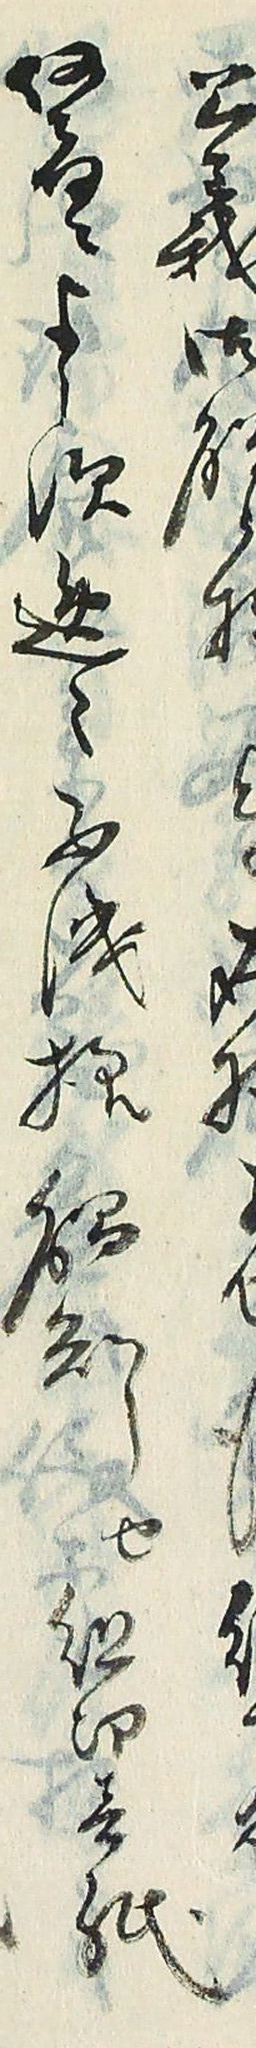何者によらす逸々不洩様触知らせ組切壱紙
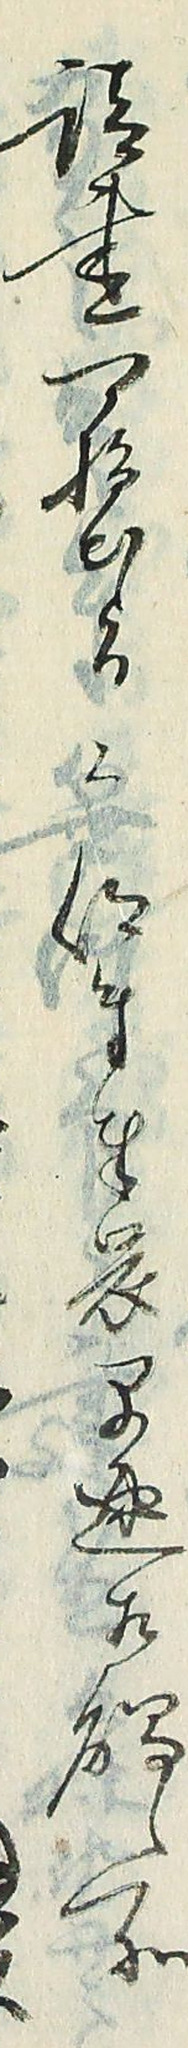請書可指出旨被仰付奉畏早速相触候所
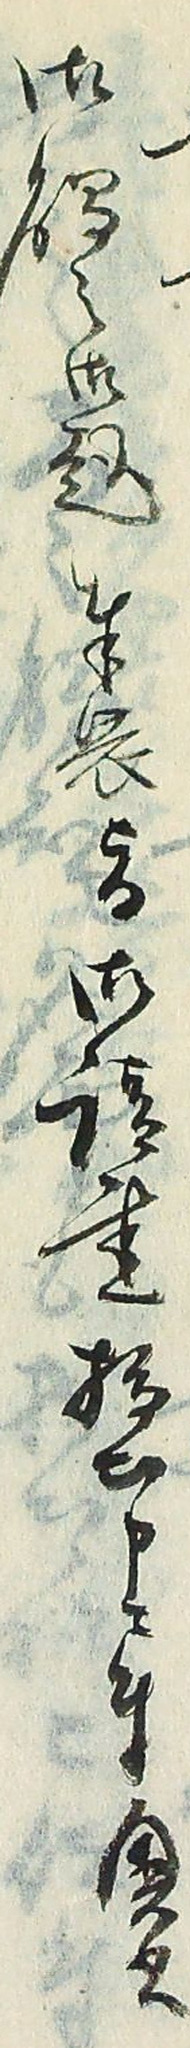御触之御趣奉畏旨御請書指出申に付奥書
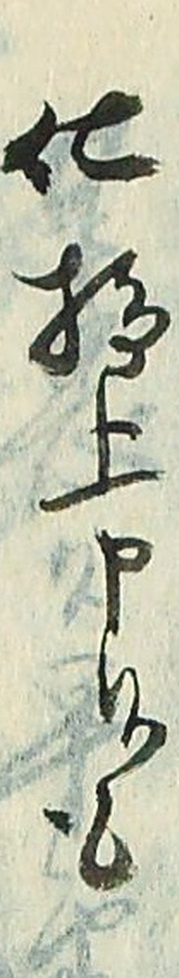仕指上申候以上
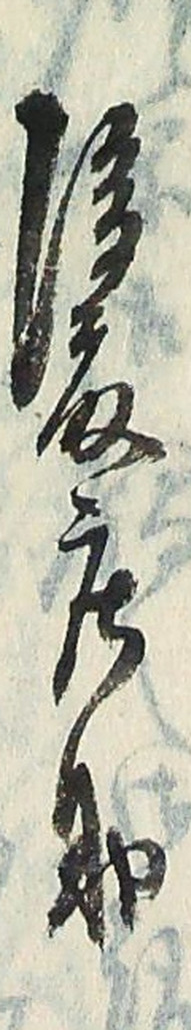後藤庄助
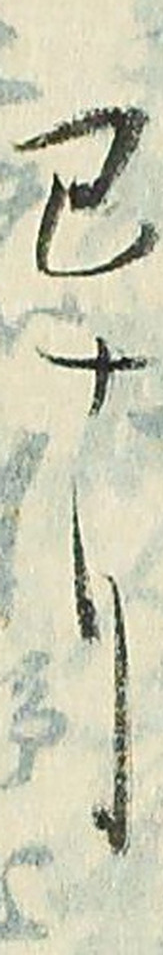巳十月
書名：諸御用御□受書控
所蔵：鳴門教育大学 Naruto University of Education
